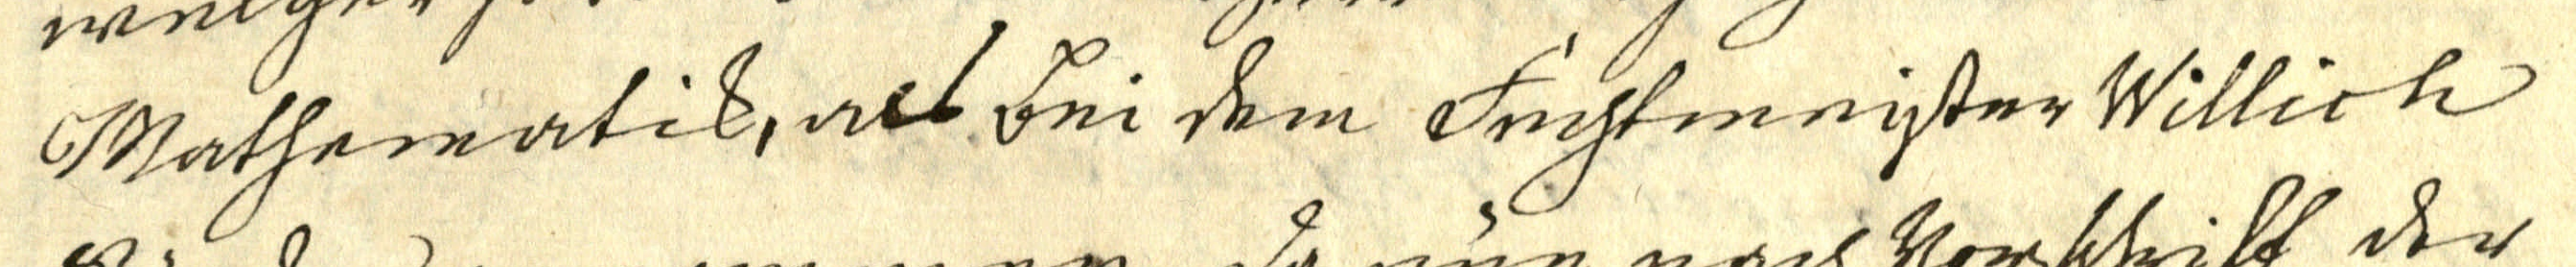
Mathematik, als bei dem Fechtmeister Willich
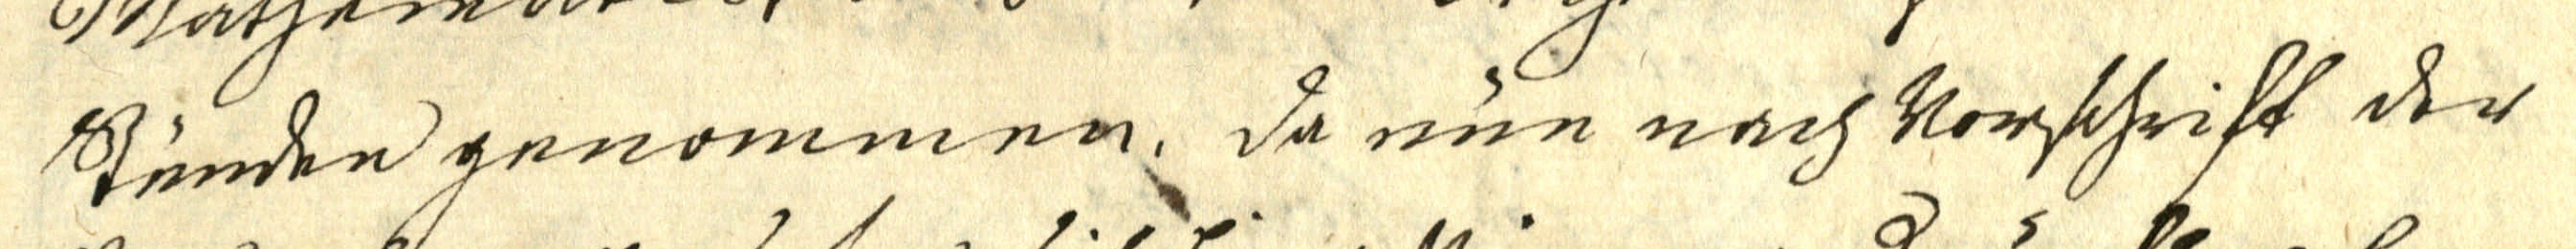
Stunden genommen, da nun nach Vorschrift der
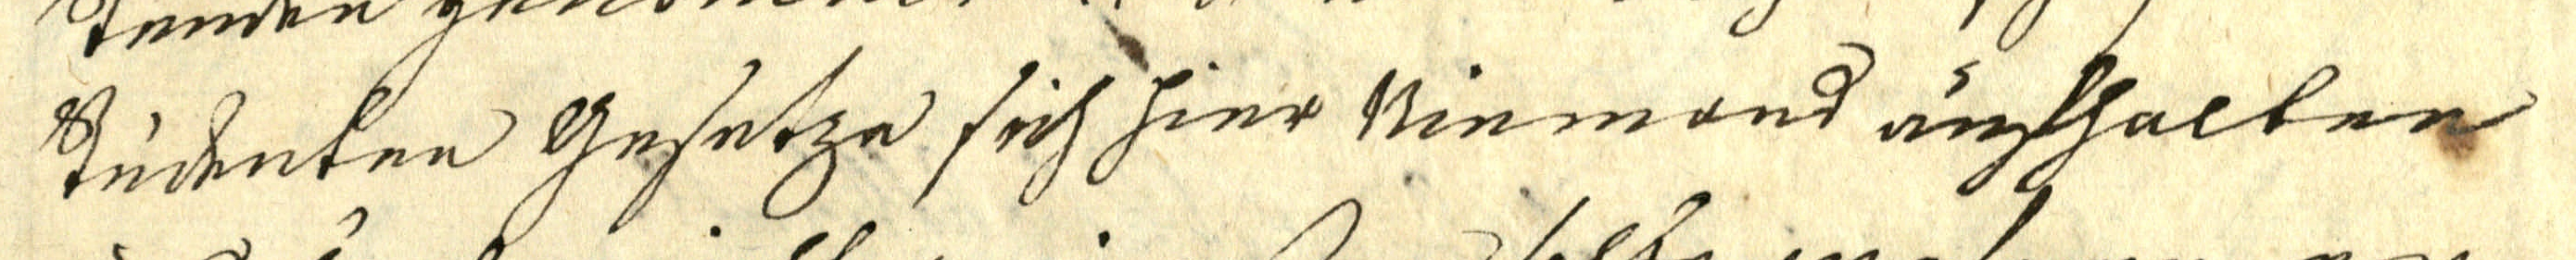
Studenten Gesetze sich hier Niemand aufhalten
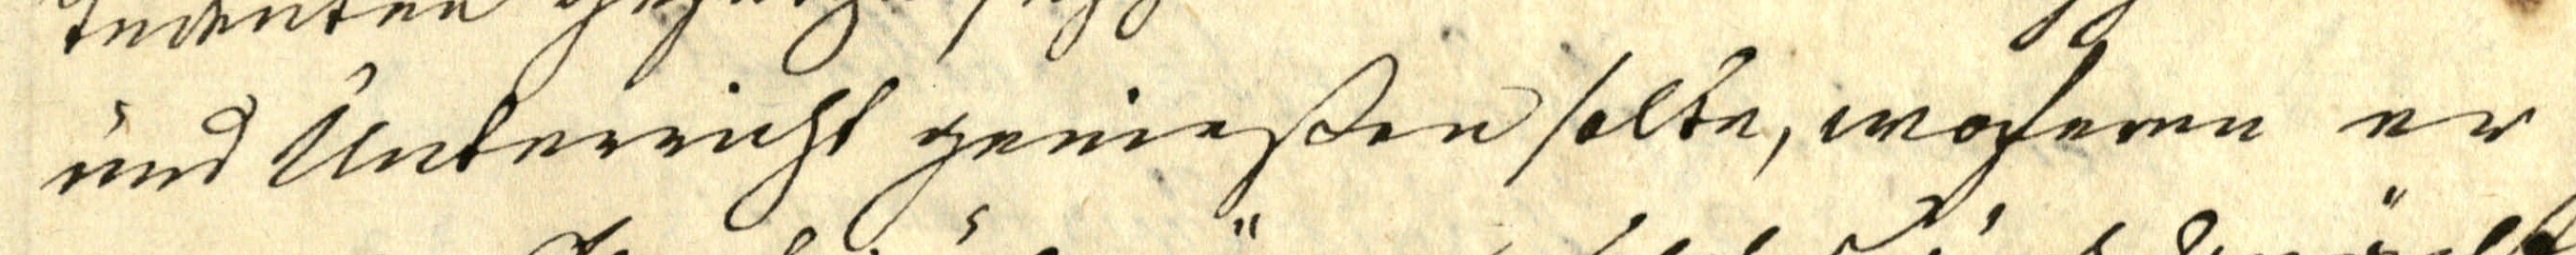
und Unterricht genießen solte, woferne er
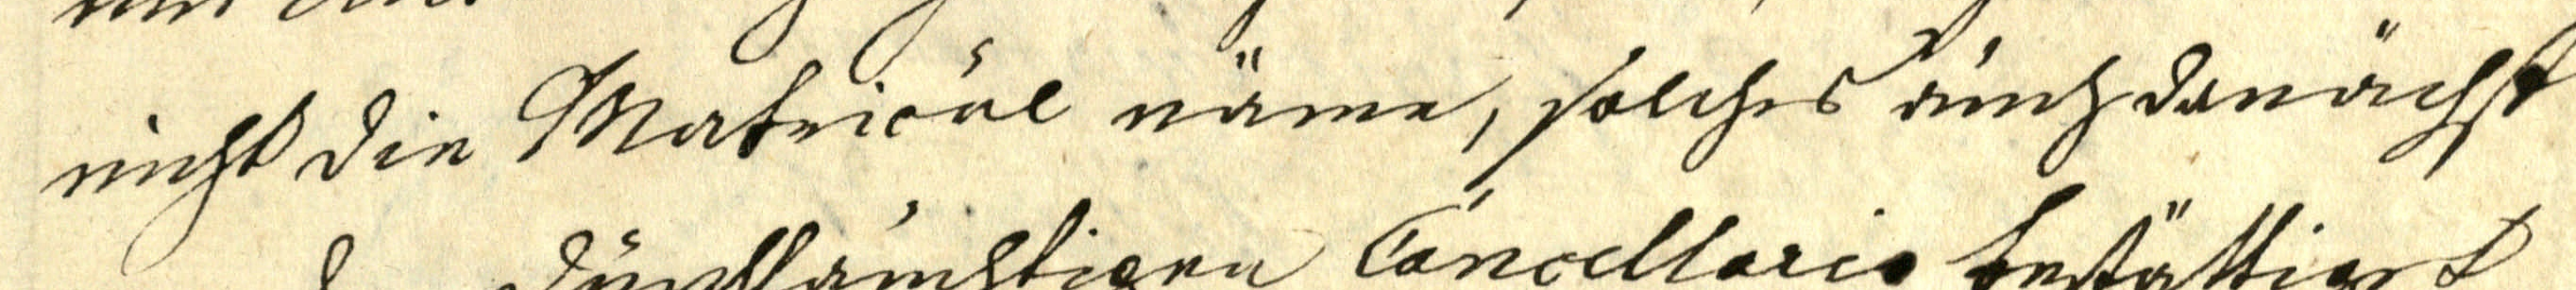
nicht die Matricul näme, solches auch danächst
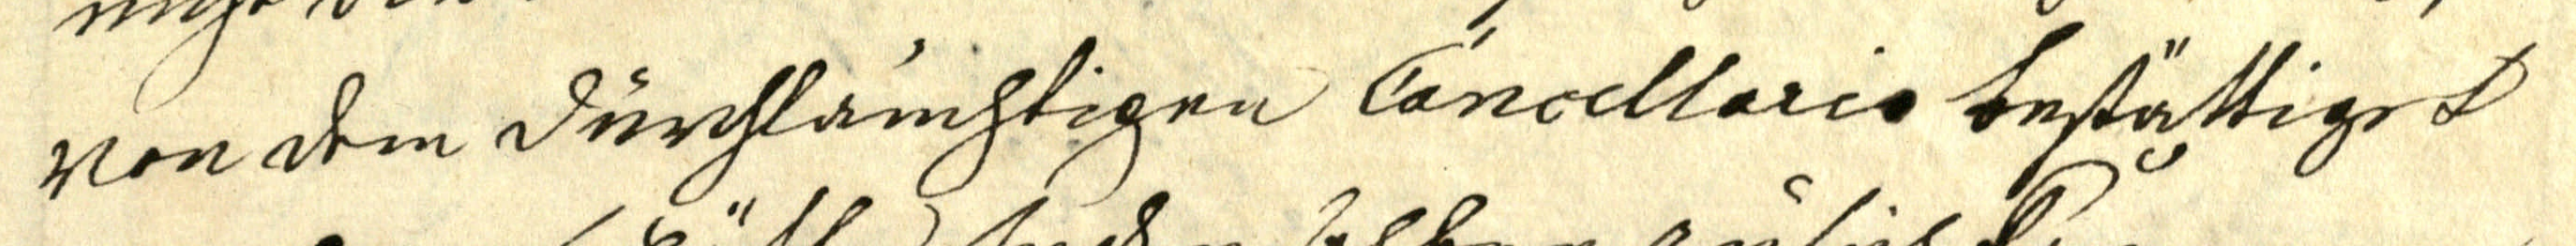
von dem durchlauchtigen Cancellario bestättiget
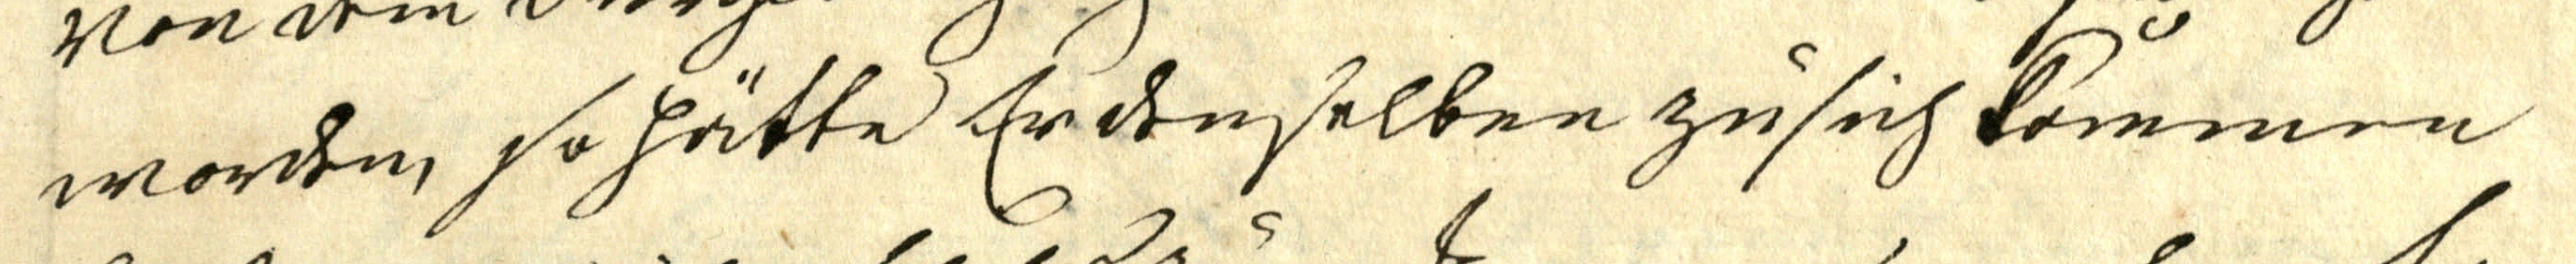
worden, so hätte Er denselben zu sich kommen
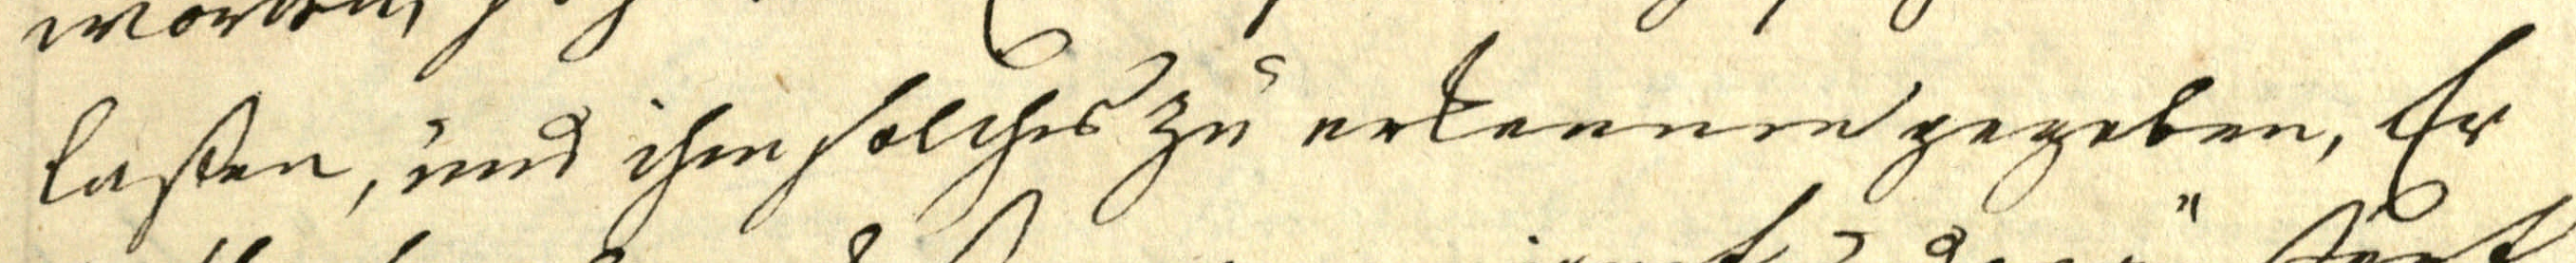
laßen, und ihm solches zu erkennen gegeben, Er
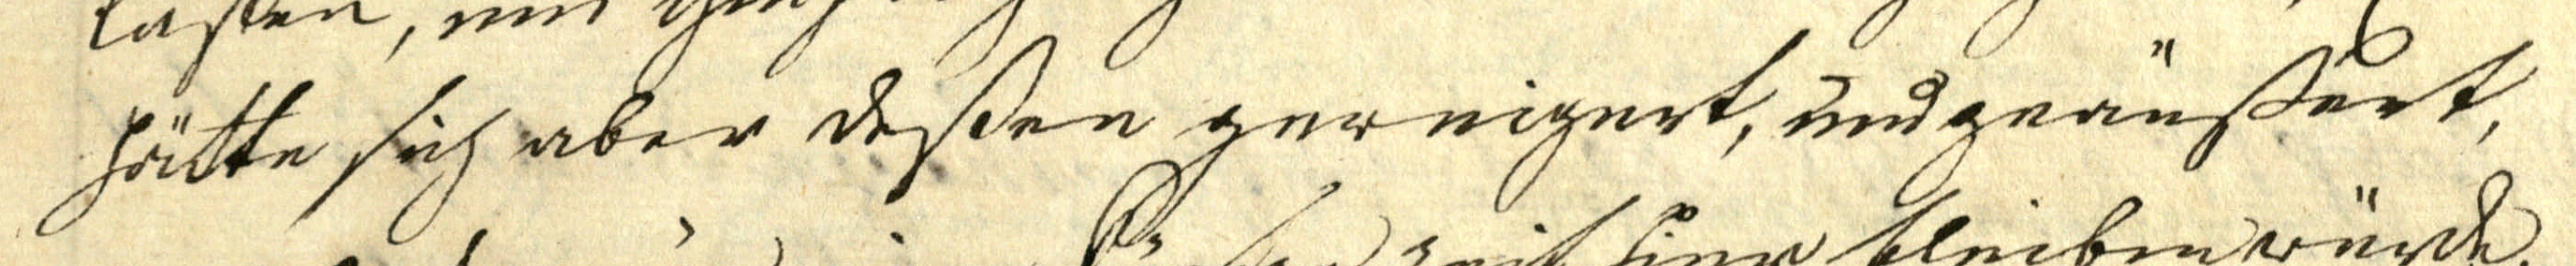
hätte sich aber deßen geweigert, und geäußert
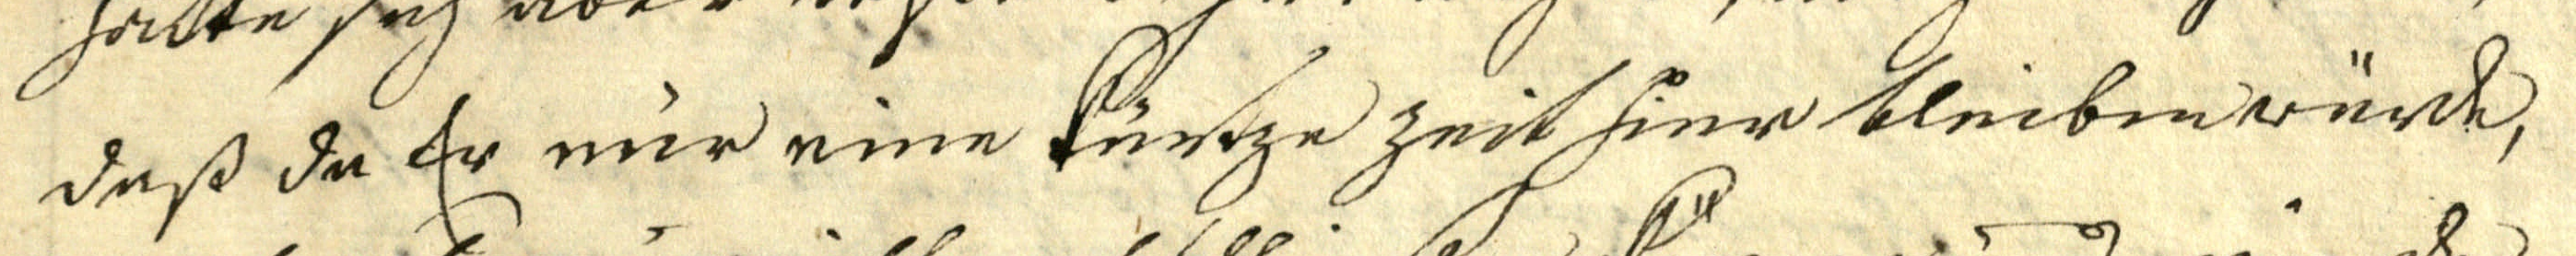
daß da Er nur eine kurze Zeit hier bleiben würde,
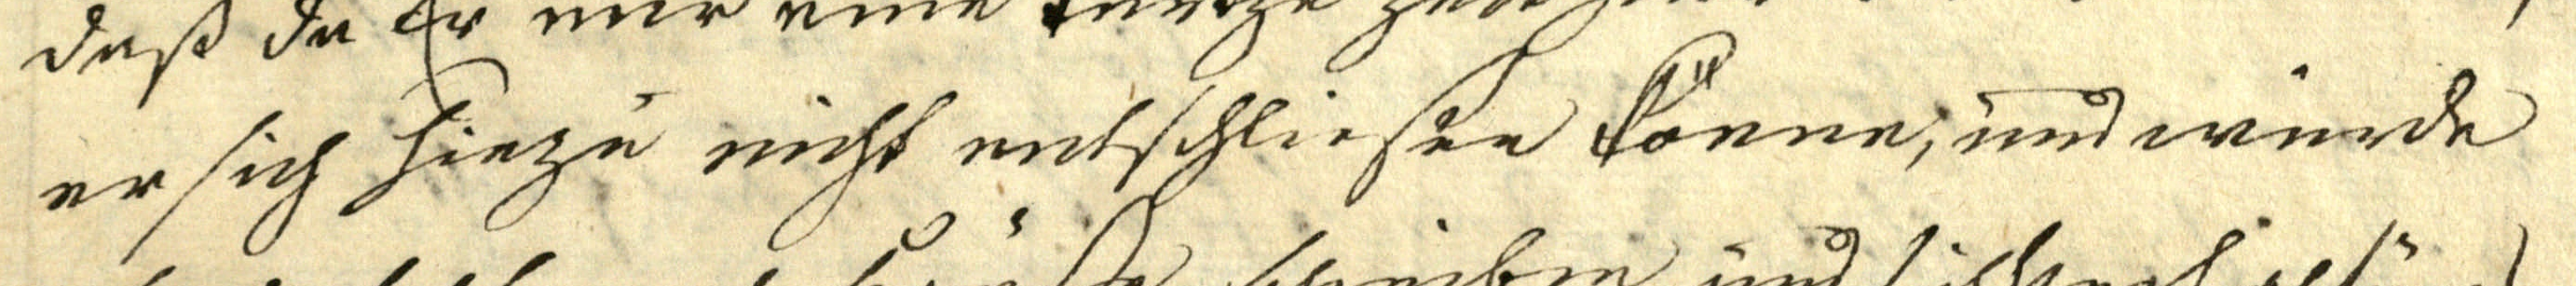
er sich hiezu nicht entschließen könne, und würde
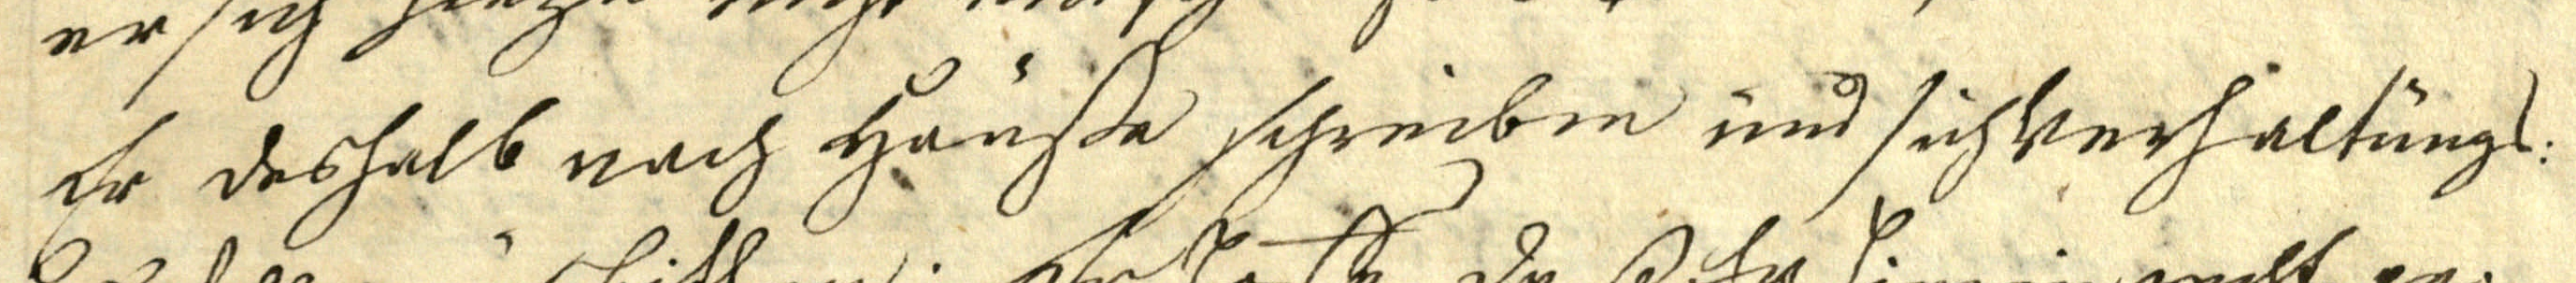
Er deshalb nach Hause schreiben und sich Verhaltungs¬
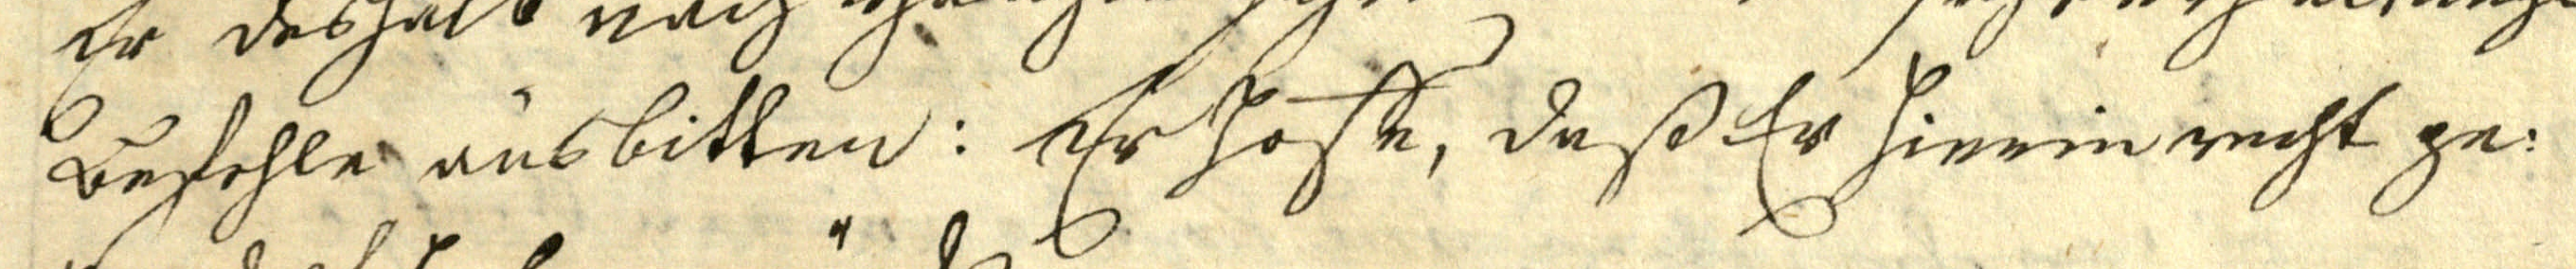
Befehle ausbitten. Er hoffe, daß Er hierin recht ge¬
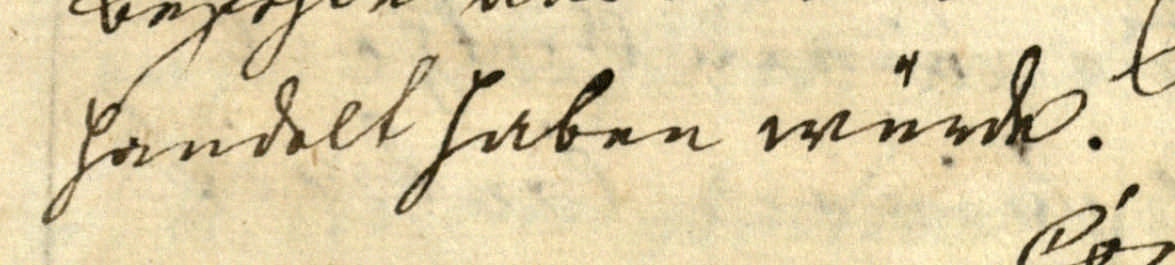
handelt haben würde.
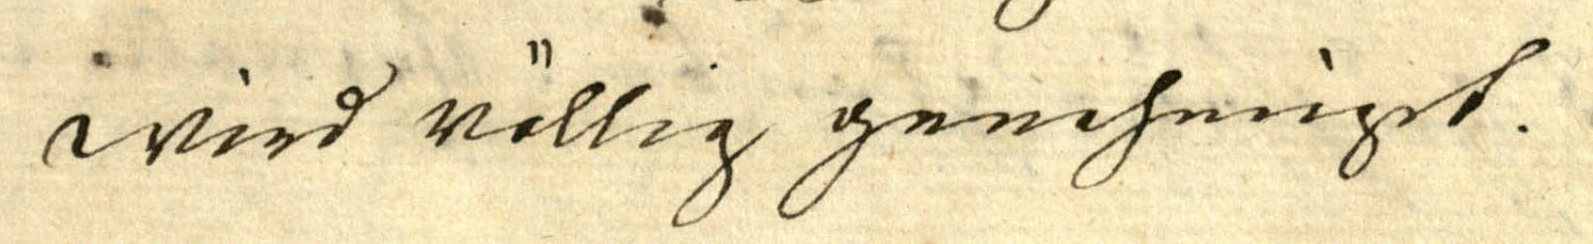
wird völlig genehmiget.
